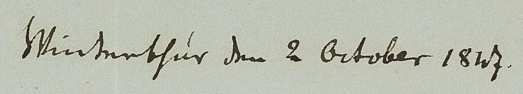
Winterthur den 2 October 1847.
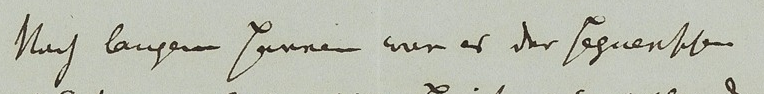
Nach langem Harren war es der Hegnerschen
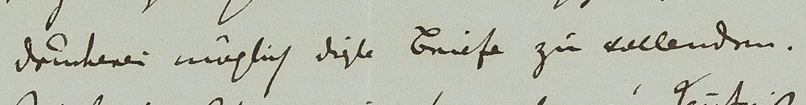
Druckerei möglich diese Briefe zu vollenden.
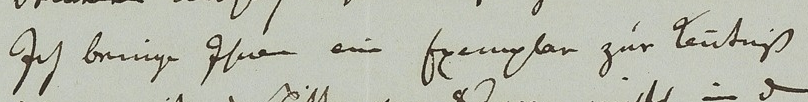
Ich bringe Ihnen ein Exemplar zur Kenntniß
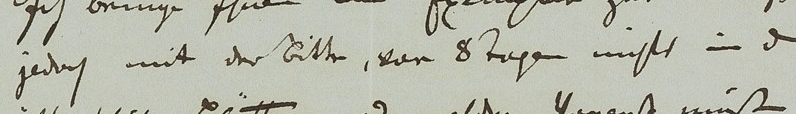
jedoch mit der bitte, vor 8 Tagen nichts in den
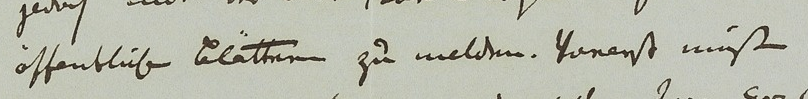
öffentlichen Blättern zu melden. Vorerst müssen
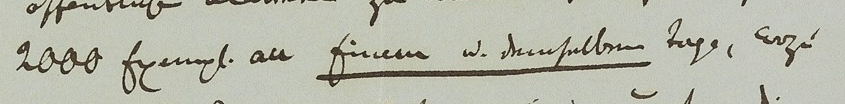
2000 Exempl. an Einem u. demselben Tage, wozu
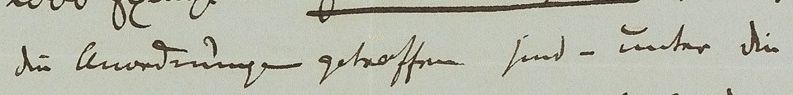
die Anordnungen getroffen sind – unter die
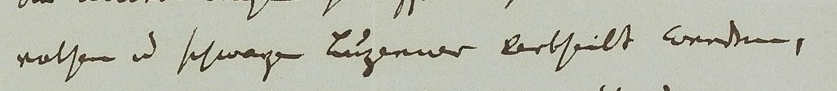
rothen u schwarzen Luzerner vertheilt werden,
